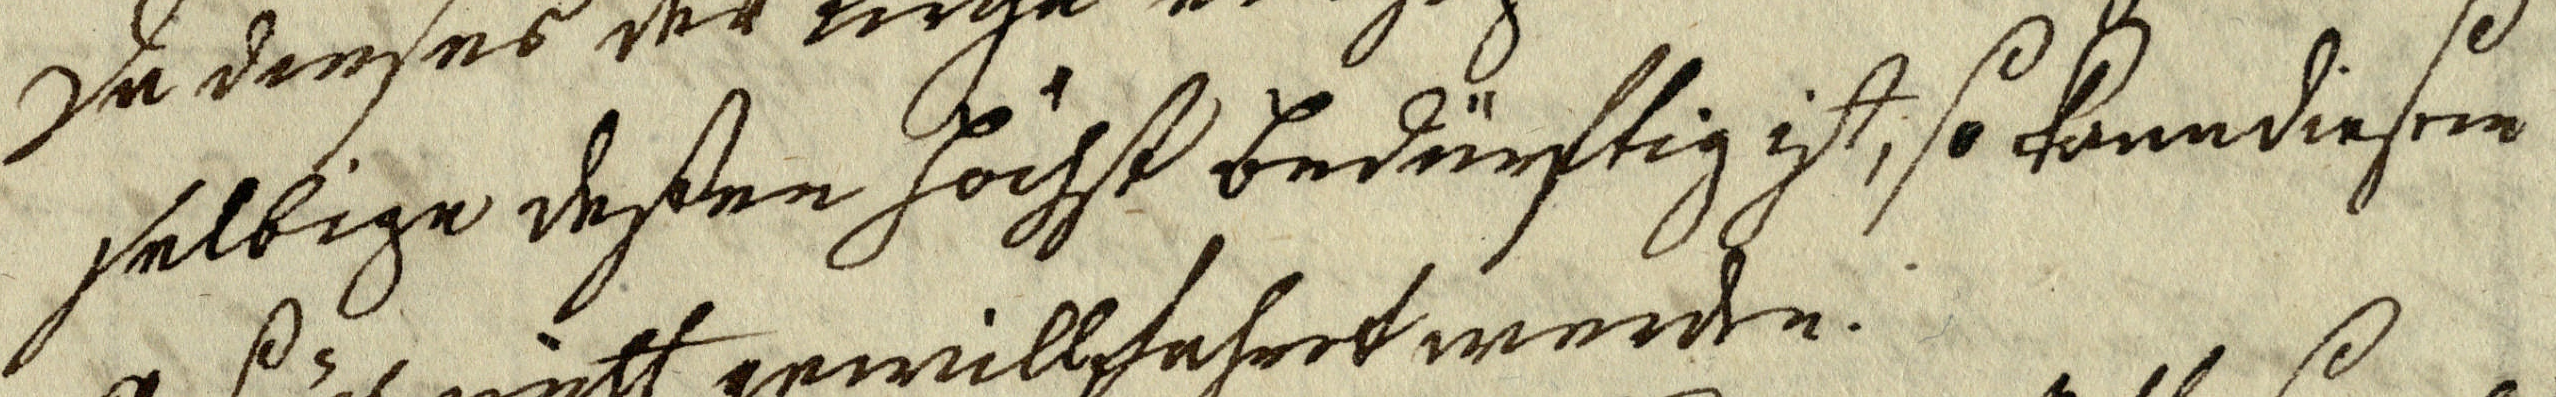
selbige dessen höchst bedürftig ist, so kann diesem
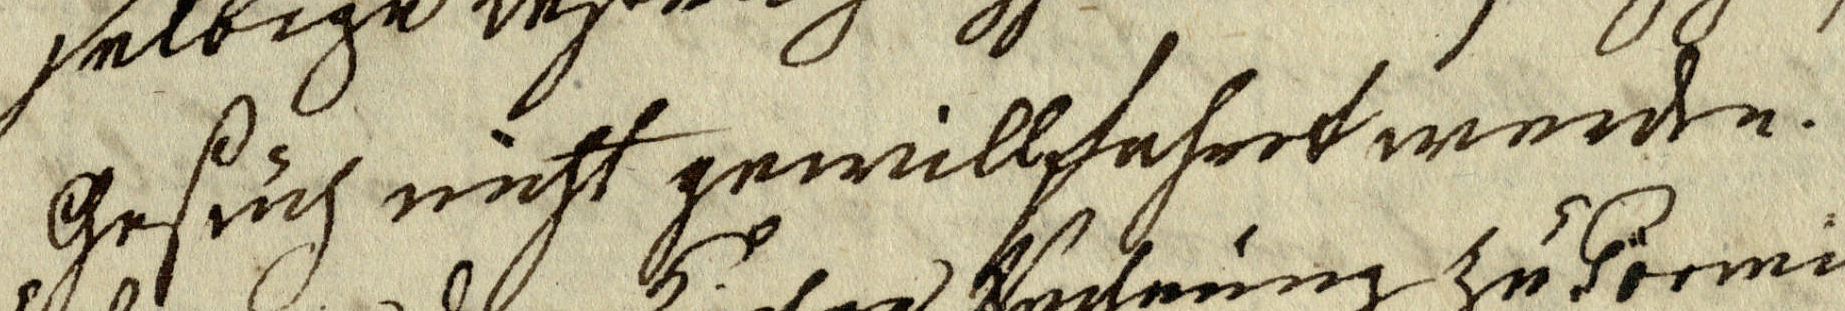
Gesuch nicht gewillfahret werden.
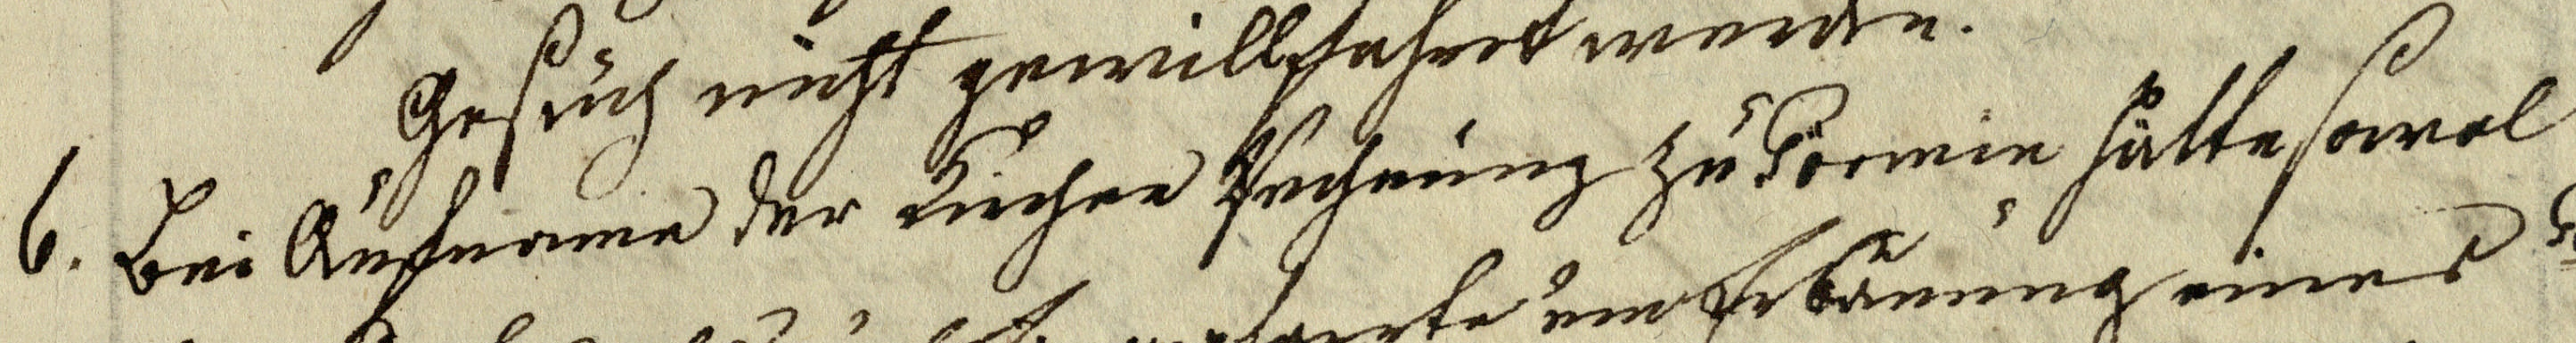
6. Bei Aufname der Kirchen Rechnung zu Görmin hätte sowol
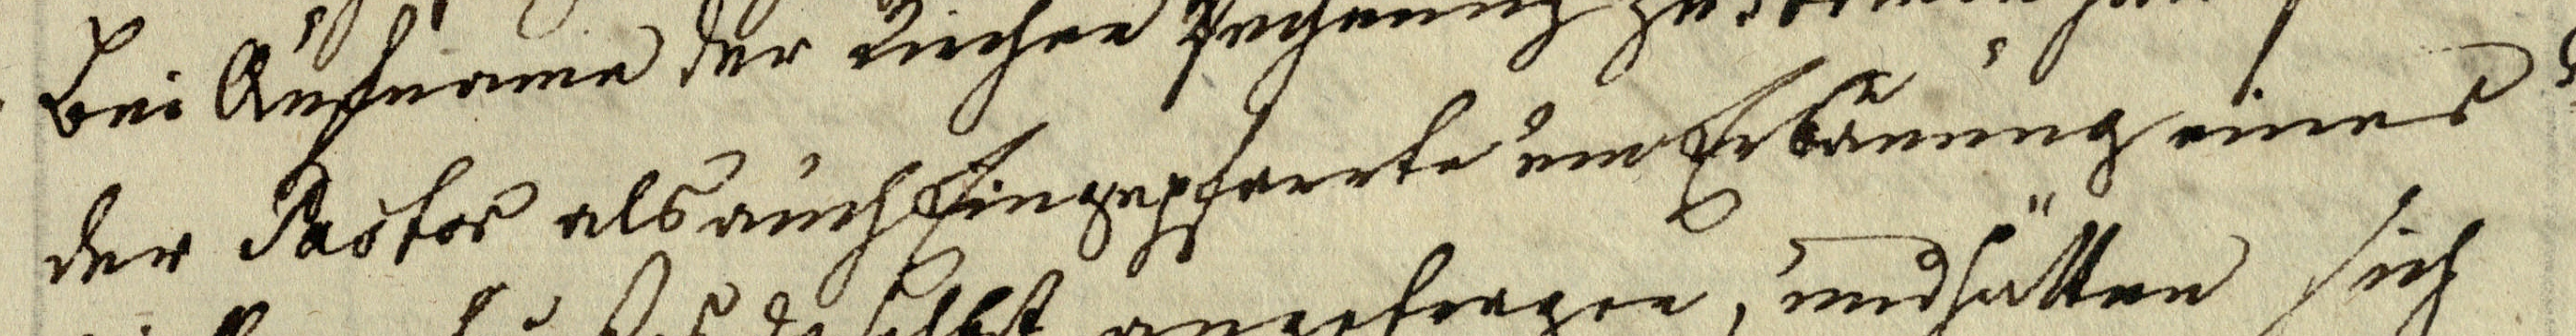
der Pastor als auch Eingepfarrte um Erbauung eines
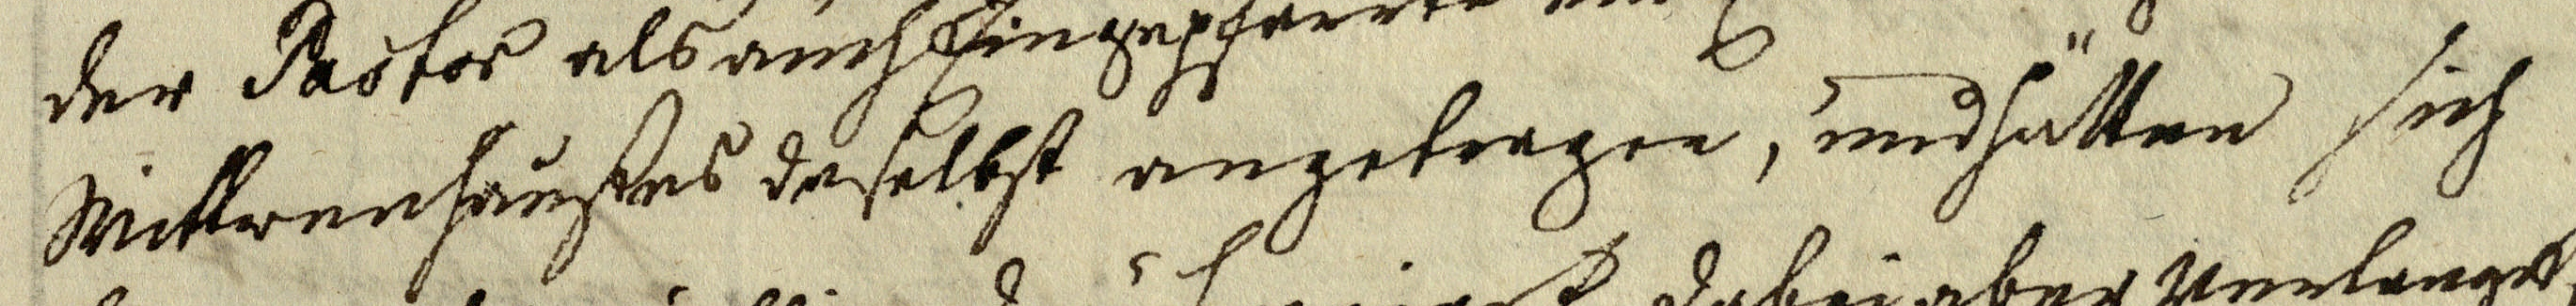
Wittwenhauses daselbst angetragen, und hätten sich
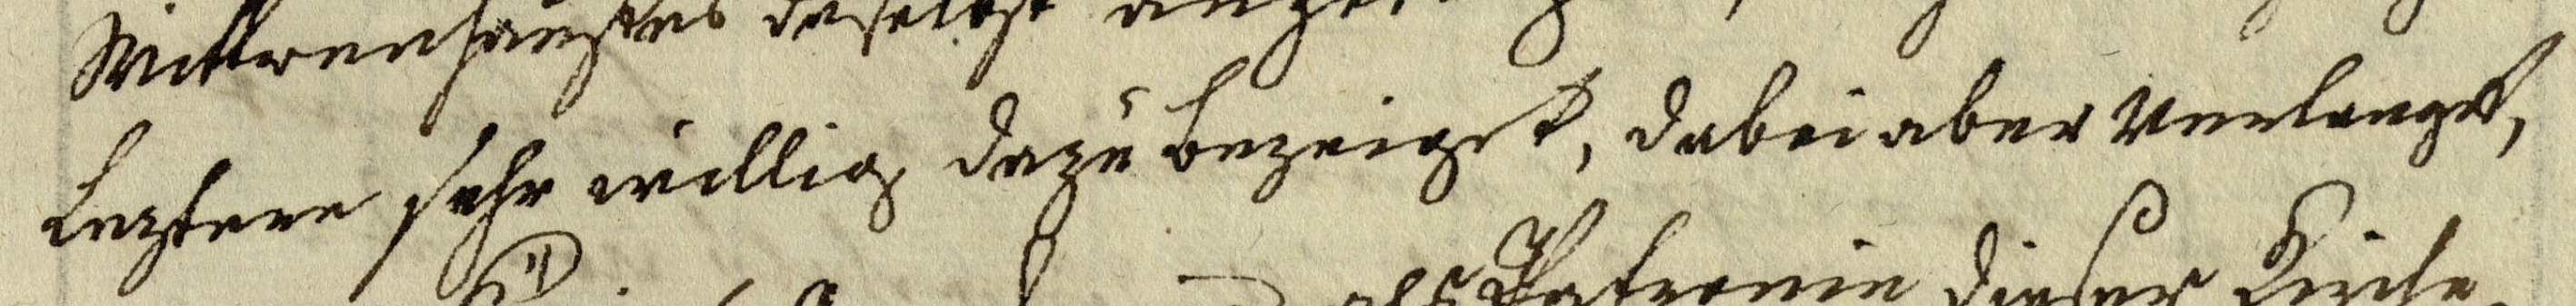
leztere sehr willig dazu bezeiget, dabei aber verlangt,
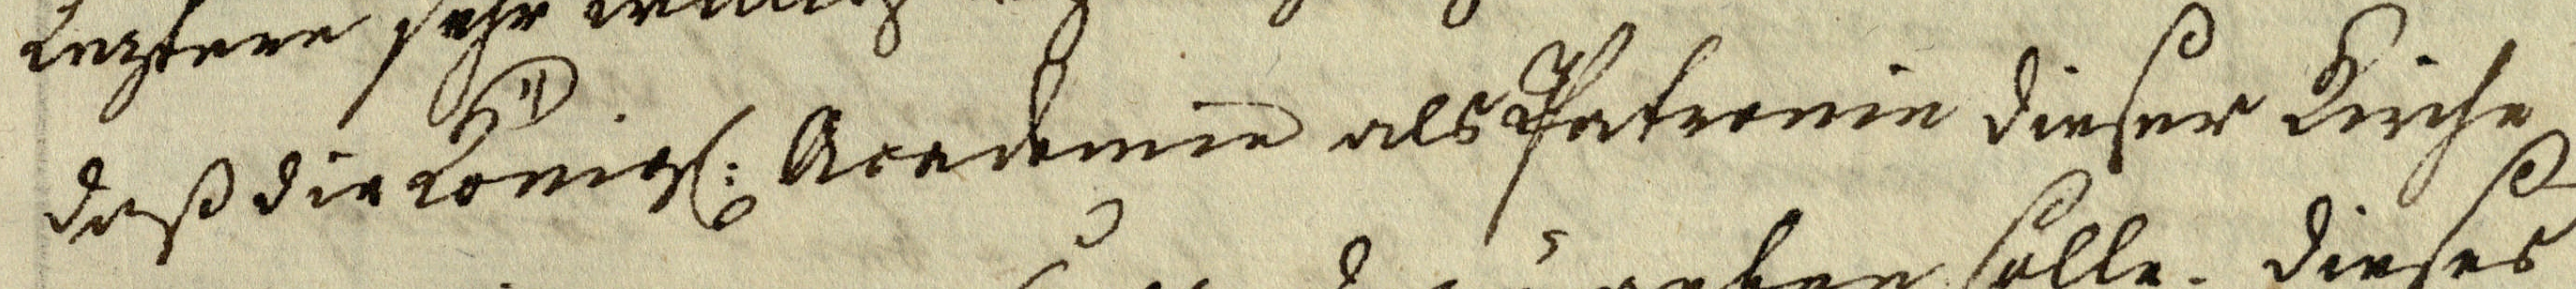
daß die Königl. Academie als Patronin dieser Kirche
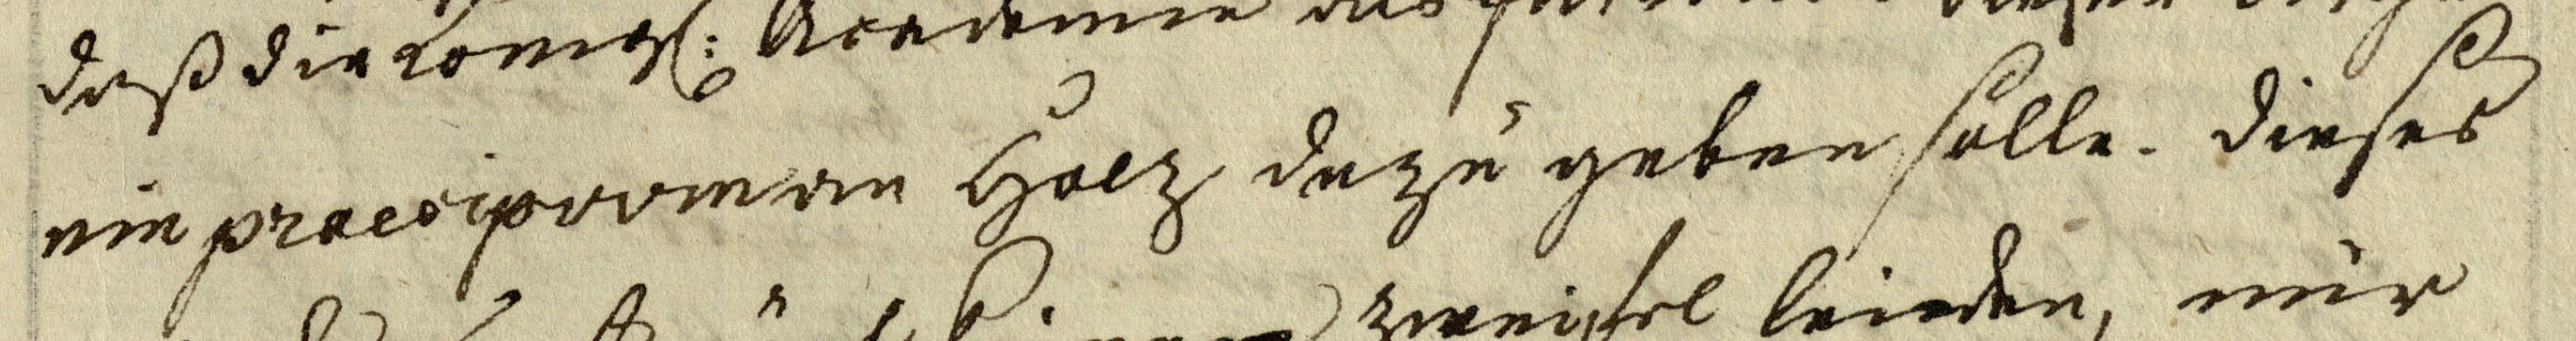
ein praecipuum an Holz dazu geben solle. Dieses
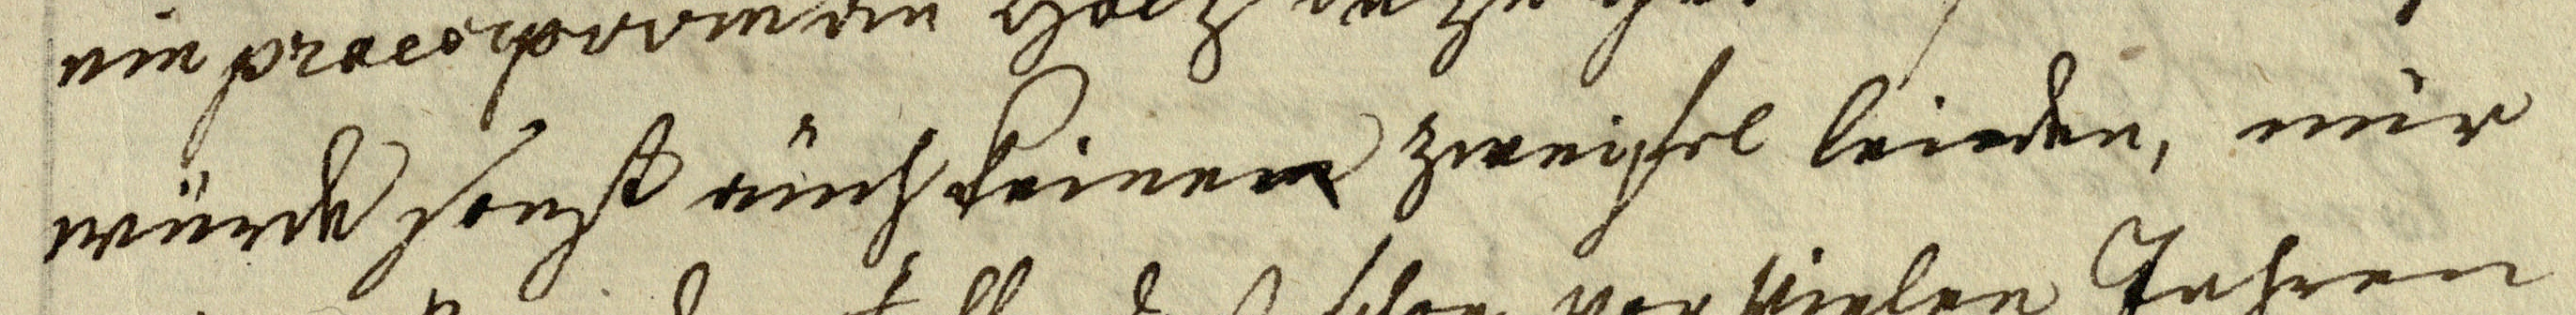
würde sonst auch keinen Zweifel leiden, nur
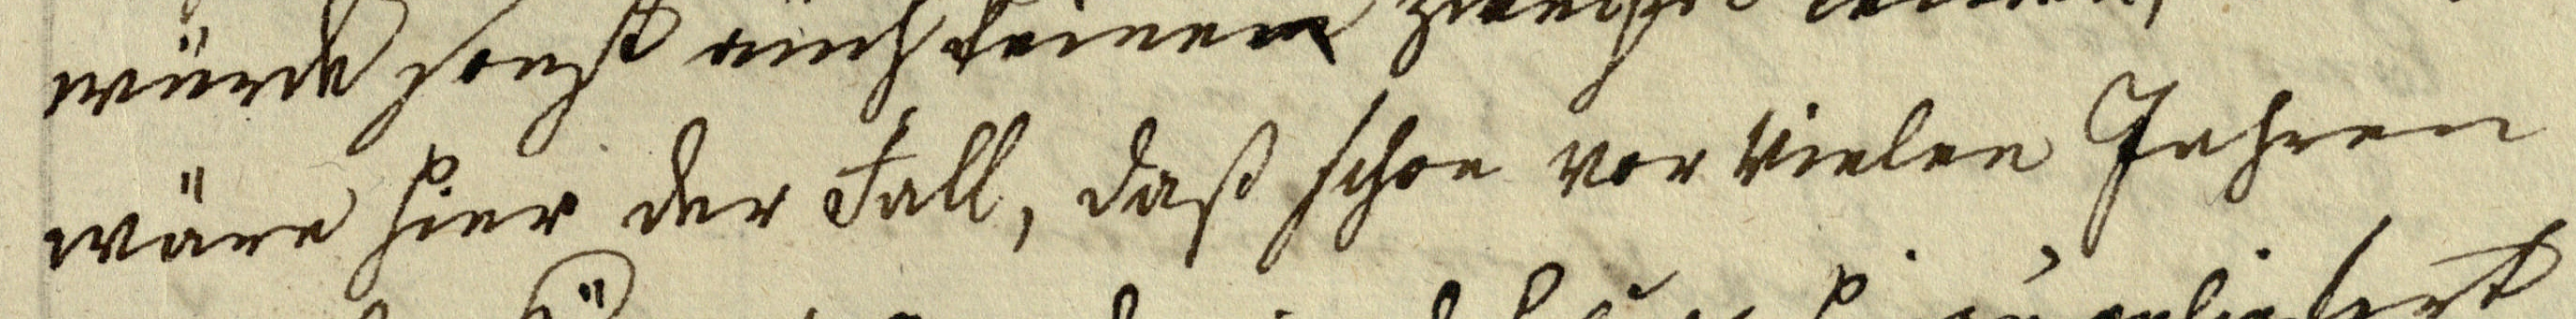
wäre hier der Fall, daß schon vor vielen Jahren
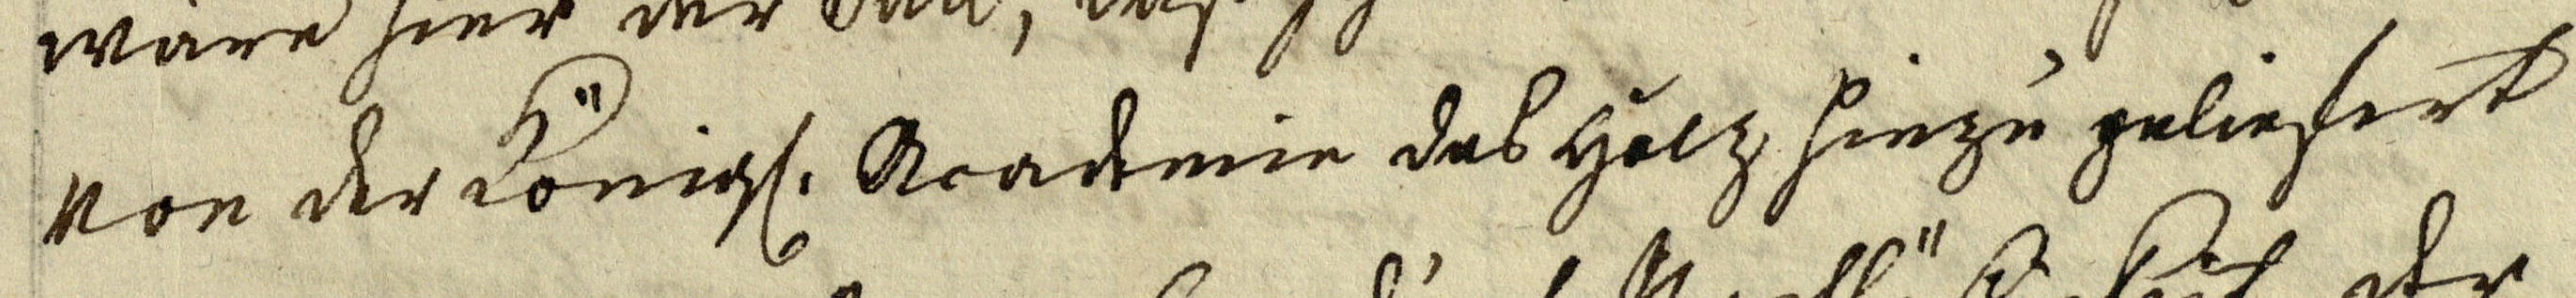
von der Königl. Academie das Holz hiezu geliefert
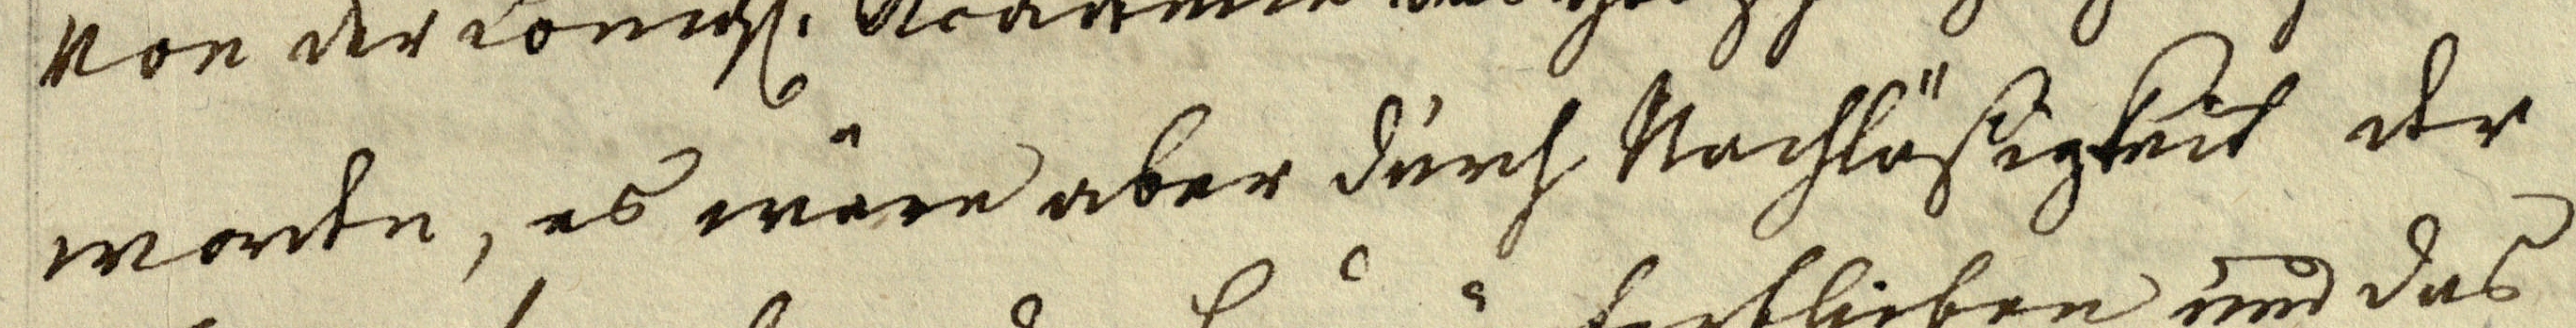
worden, es wäre aber durch Nachläßigkeit der
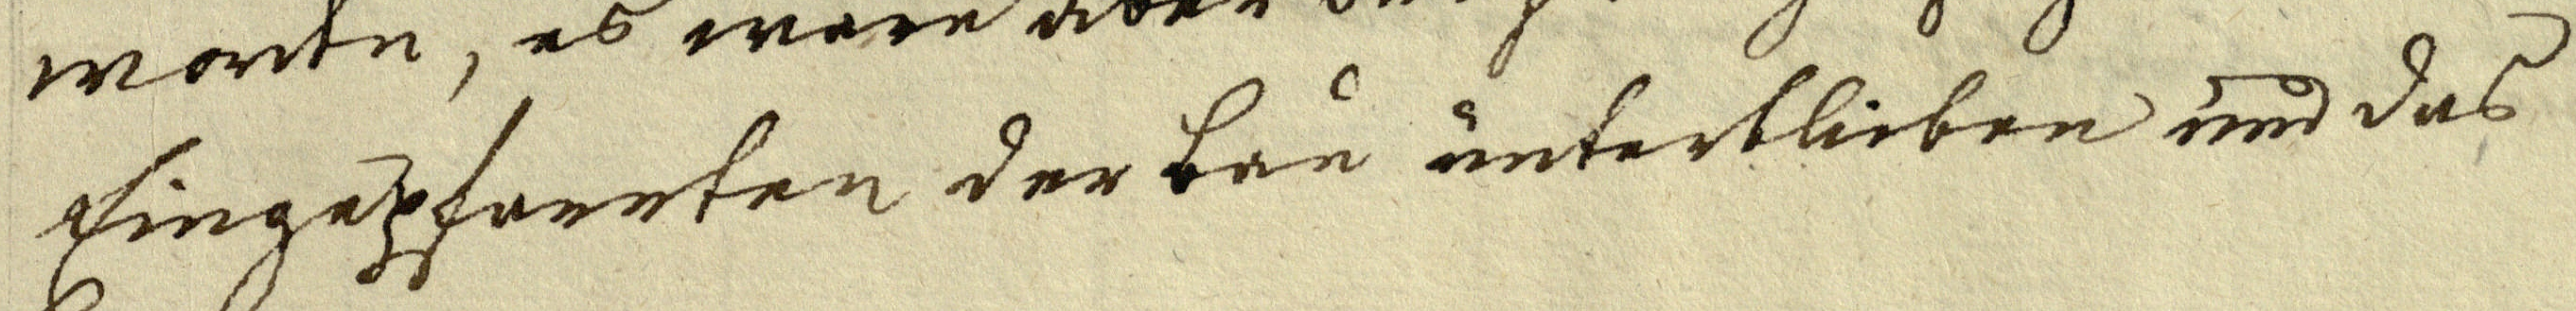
Eingepfarrten der Bau unterblieben und das
